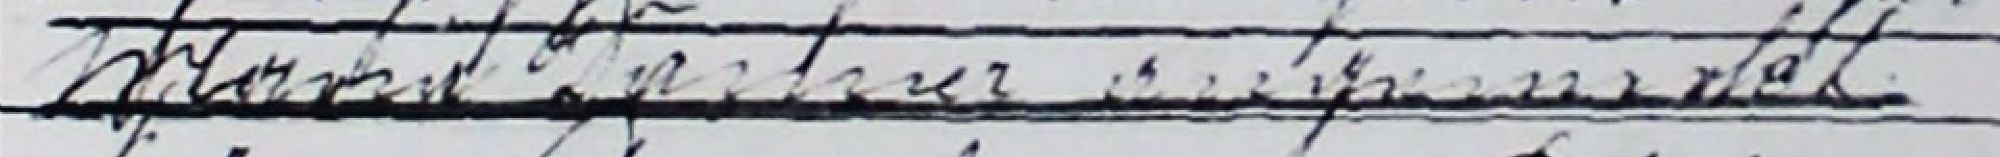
Maria Danner angemerkt.
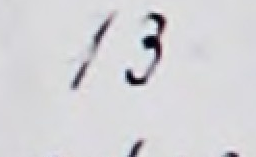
13
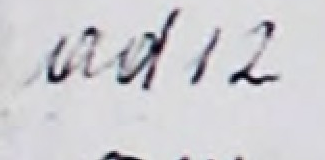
ad 12
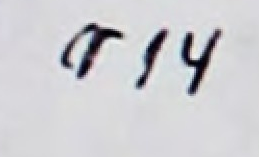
s 14
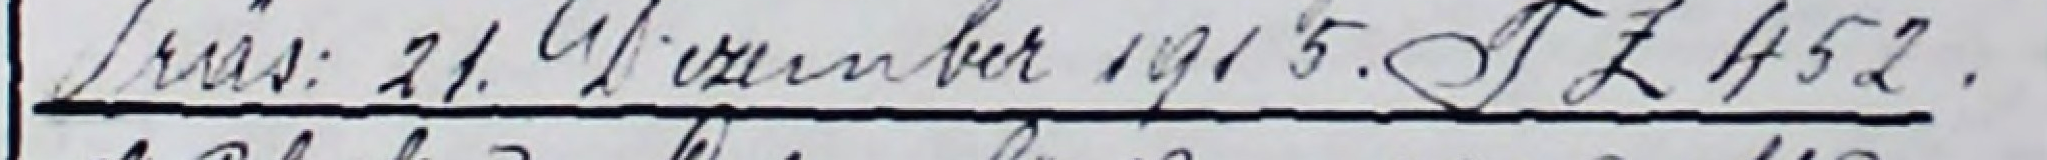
Präs: 21 Dezember 1915. T Z 452.
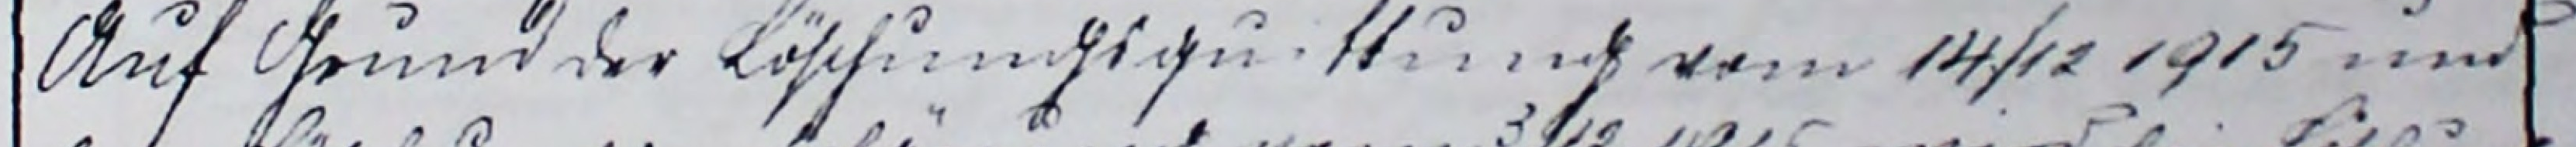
Auf Grund der Löschungsquittung vom 14/12 1915 und
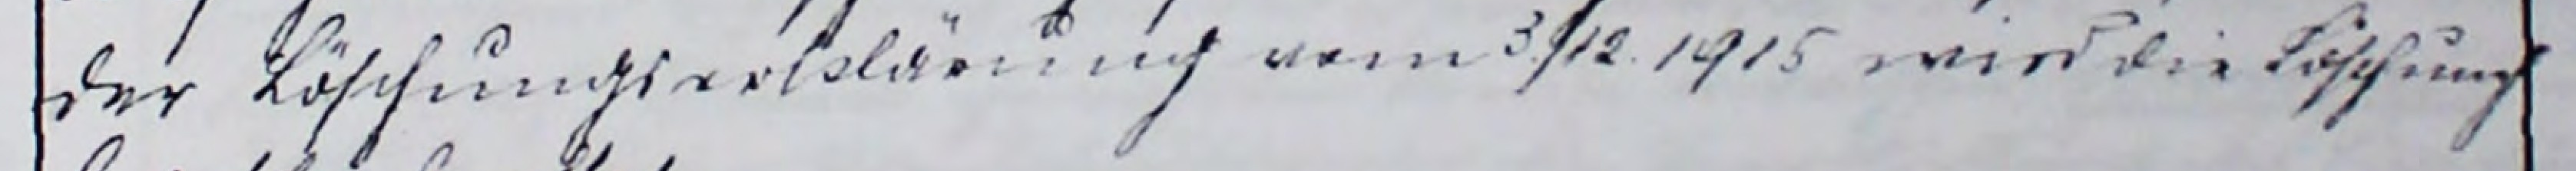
der Löschungserklärung vom 3/12. 1915 wird die Löschung
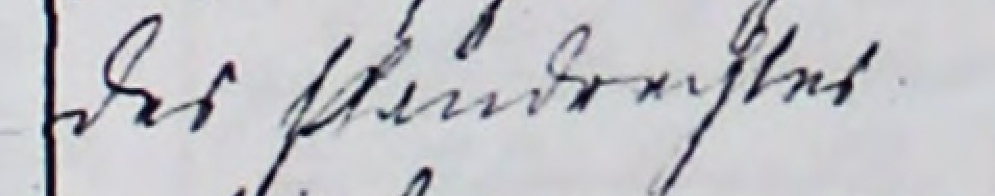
des Pfandrechtes
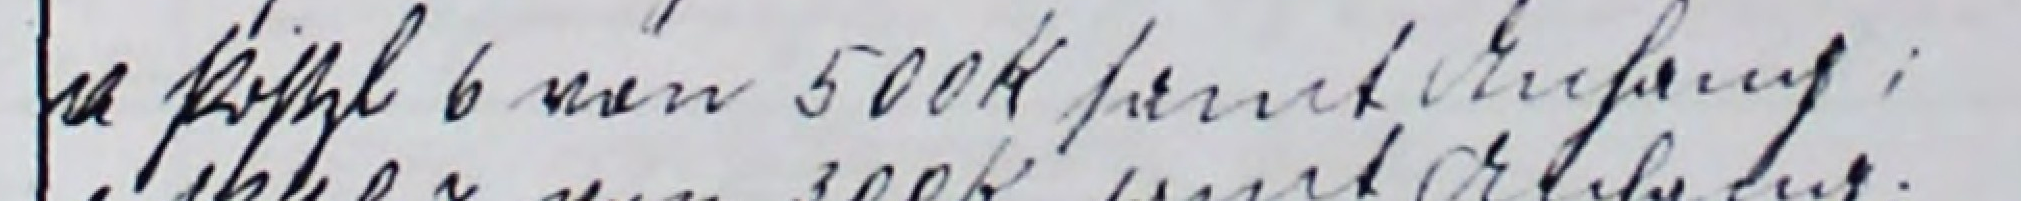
a Postzl 6 vom 500 K samt Anhang;
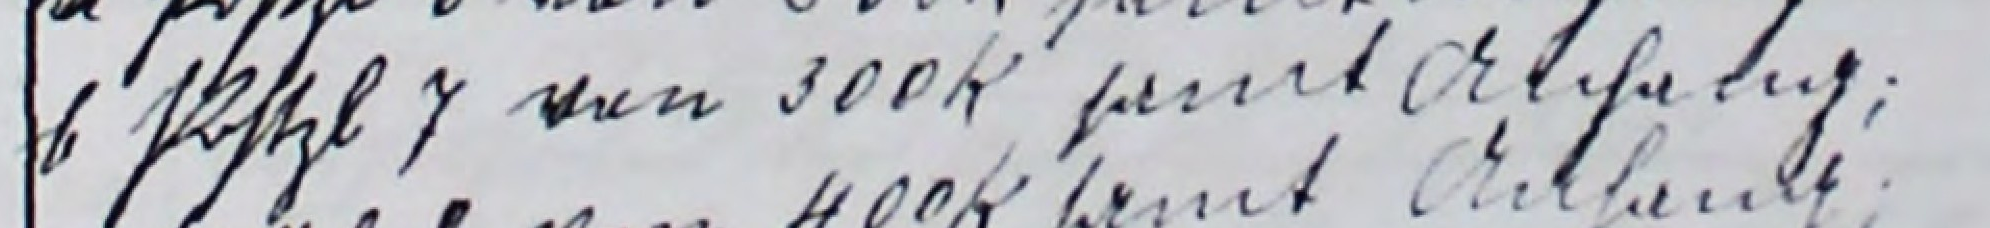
b Postzl 7 vom 300 K samt Anhang;
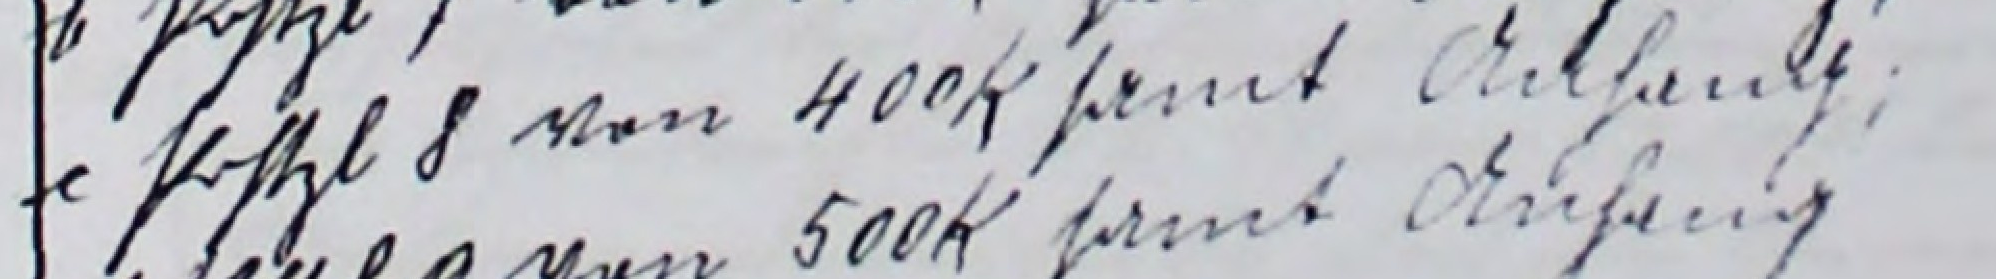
c Postzl 8 vom 400 K samt Anhang;
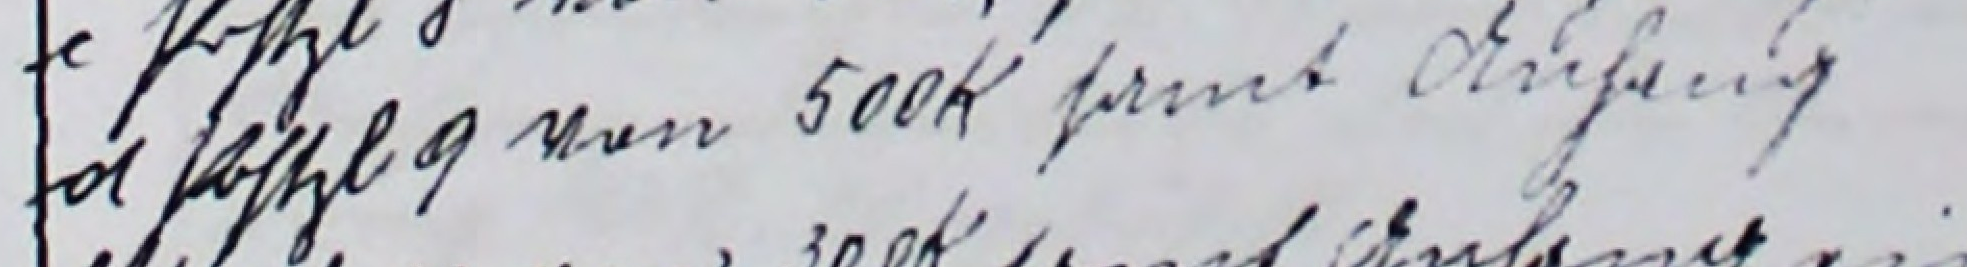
d Postzl 9 vom 500 K samt Anhang;
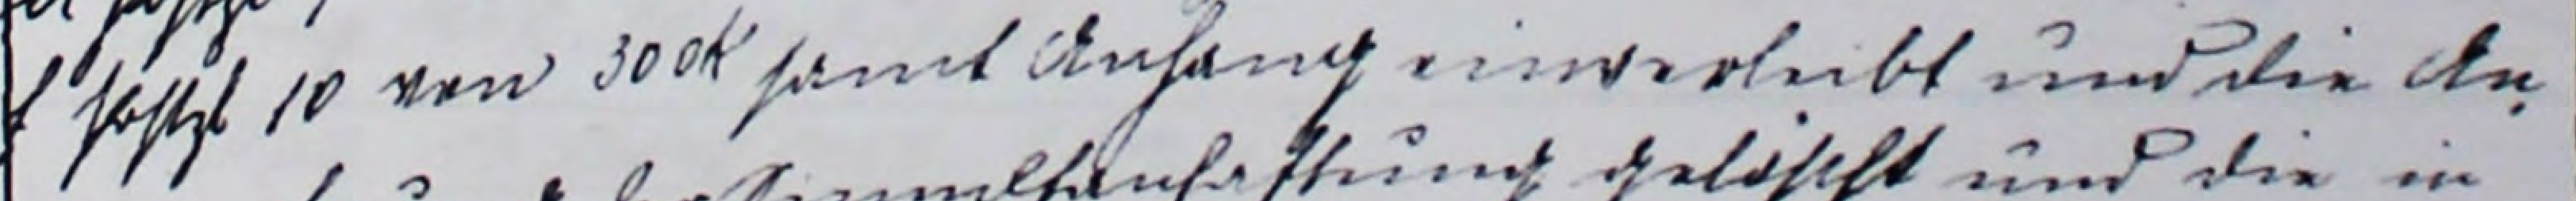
f Postzl 10 vom 300 K samt Anhang einverleibt und die An„
